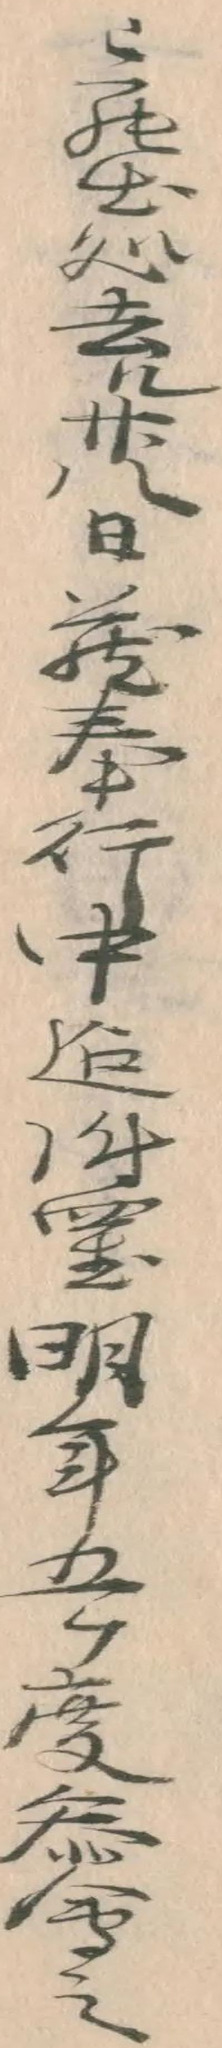被罷出処去ル廿八日蔵奉行中迄附置明年五ケ度参會之
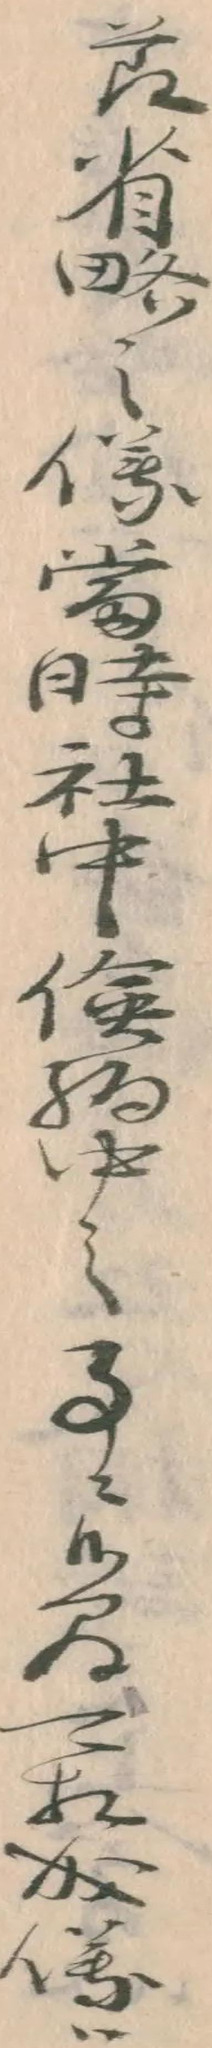節省略之儀當時社中倹約中之事ニ候間可相成儀ハ
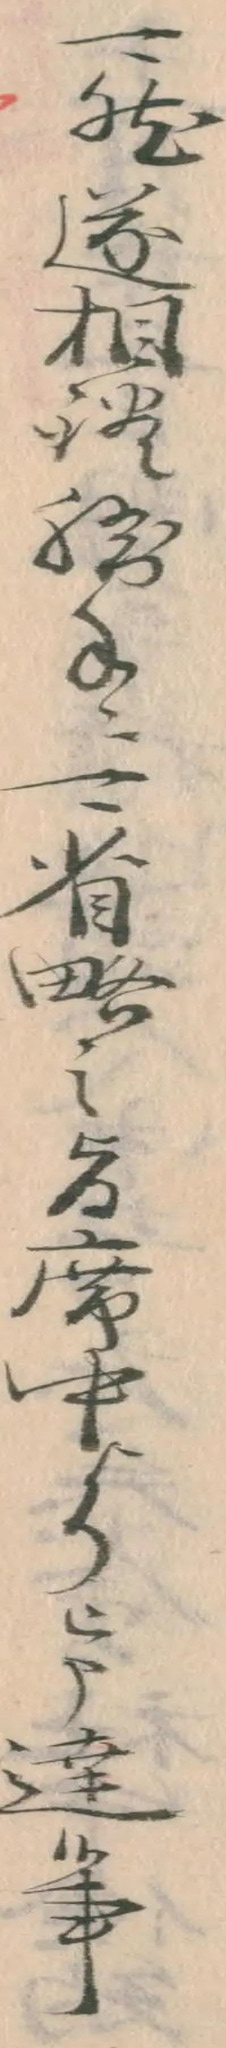可然遂相談勝手ニ可省略之旨席中より被申達候事
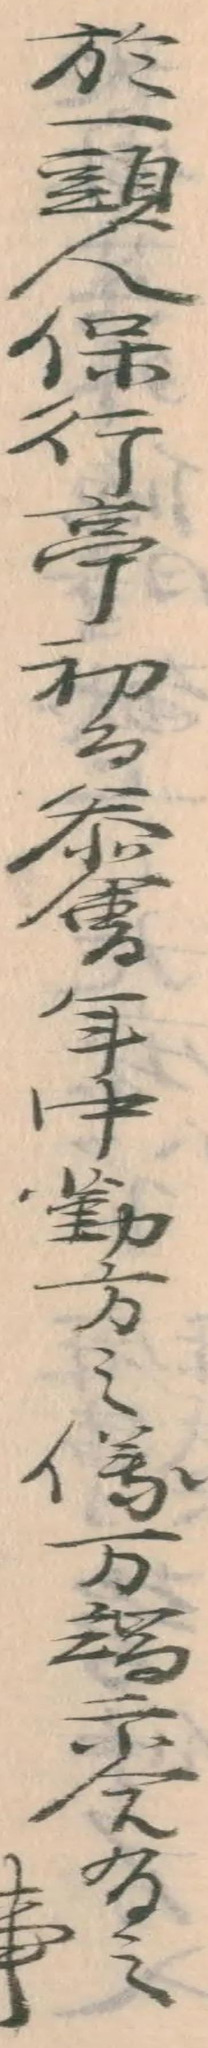於一頭人保行亭初而参會年中勤方之儀万端示合有之事
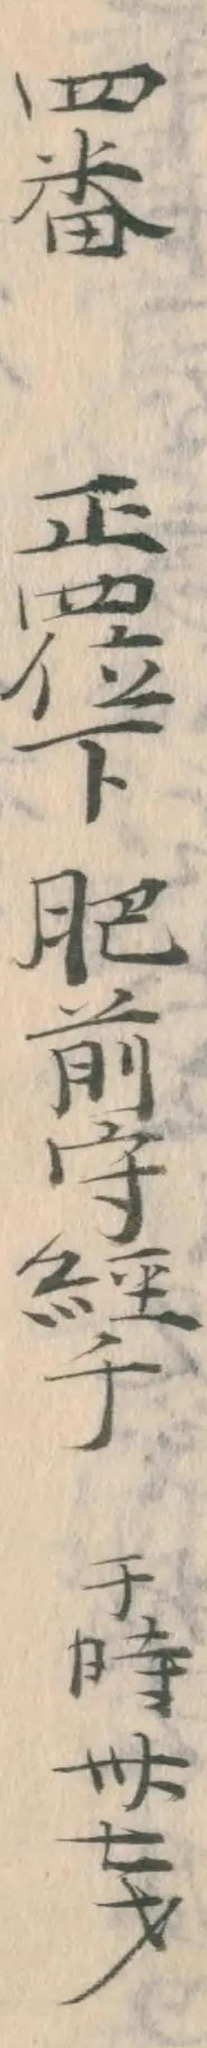四番正四位下肥前守経千于時卅七才
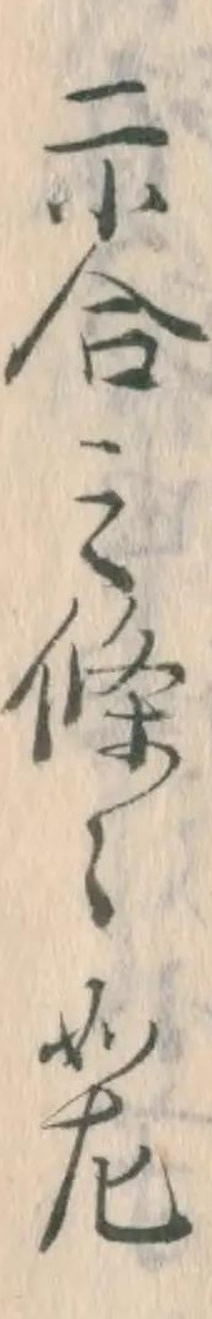示合之條々如左
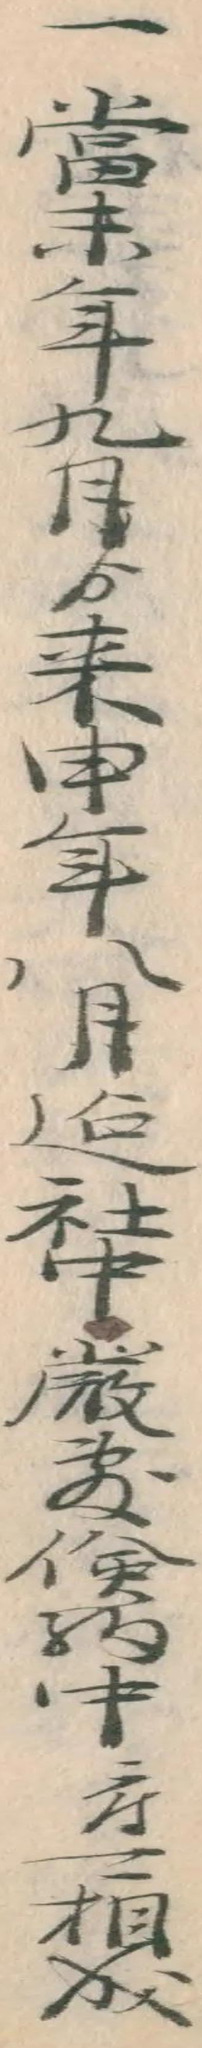一當未年九月ゟ来申年八月迄社中厳敷倹約中ニ付可相成
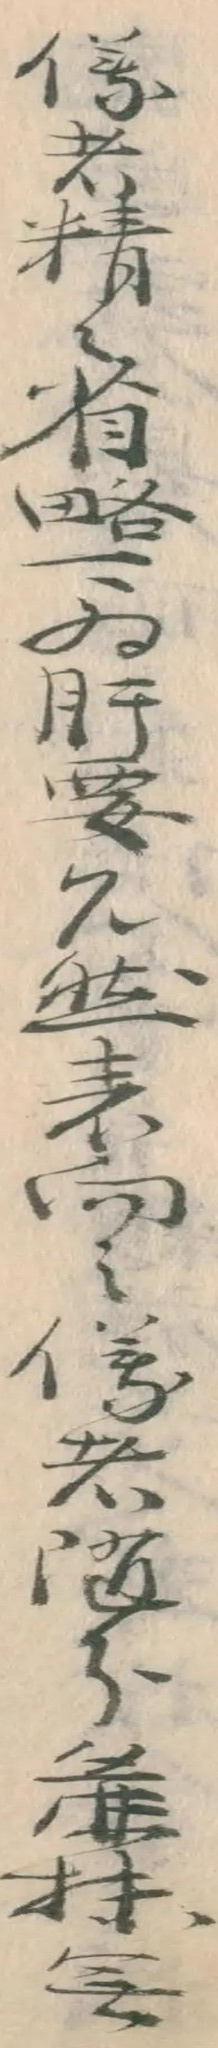儀者精〻省略可為肝要乍然表向之儀者随分麁抹無
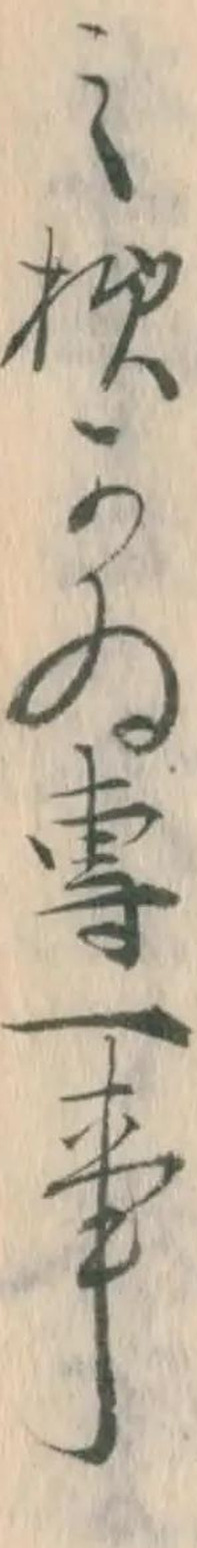之様可為専一事

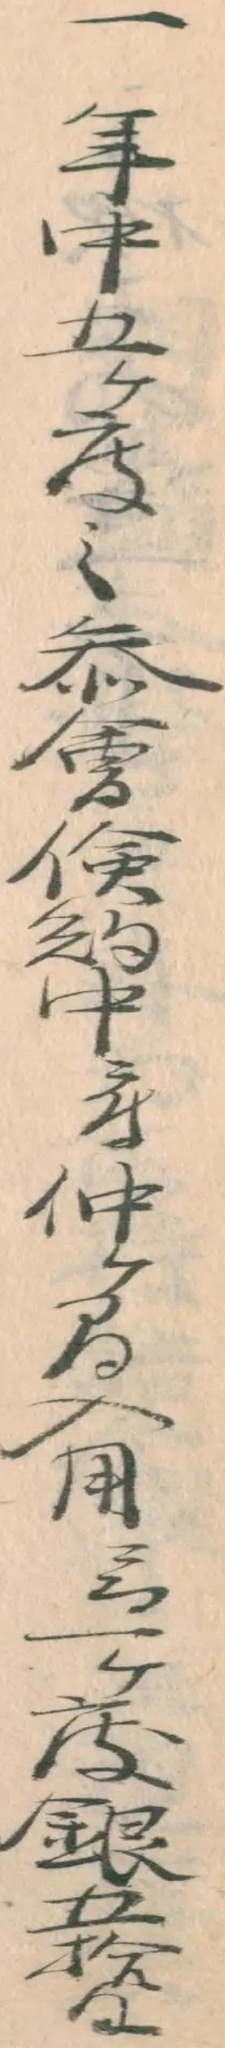一年中五ヶ度之参會倹約中ニ付仲ケ間入用ニ而一ケ度銀五拾匁
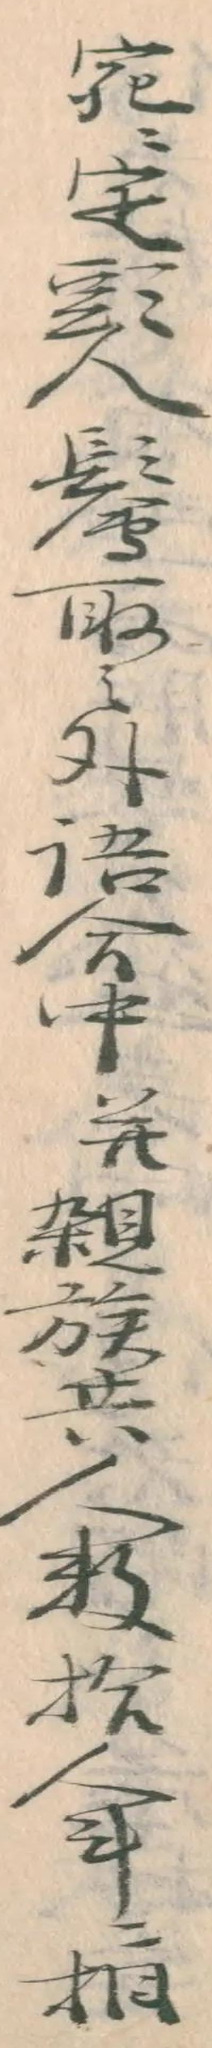宛ニ定頭人鬠取之外語合中幷親族共人数拾人斗ニ相
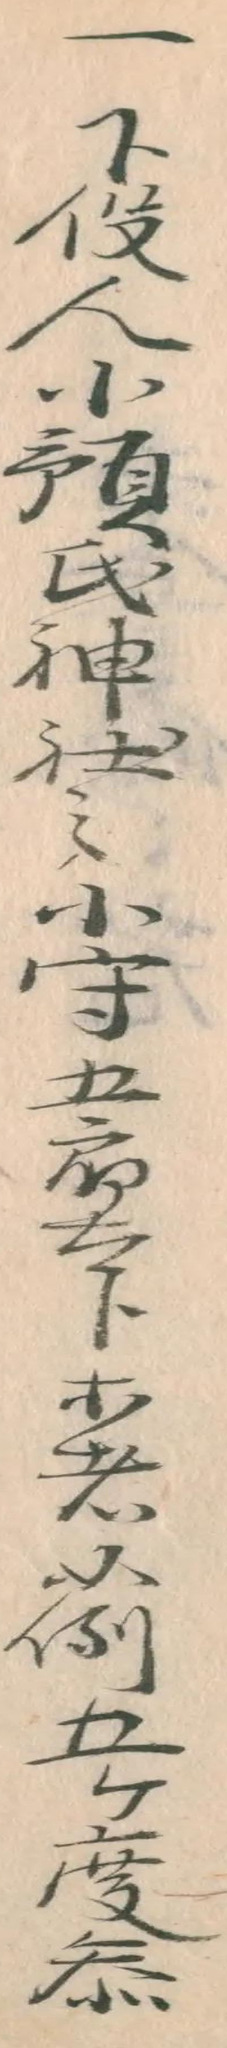一下役人小預氏神社之小守五郎太郎等者如例五ケ度参
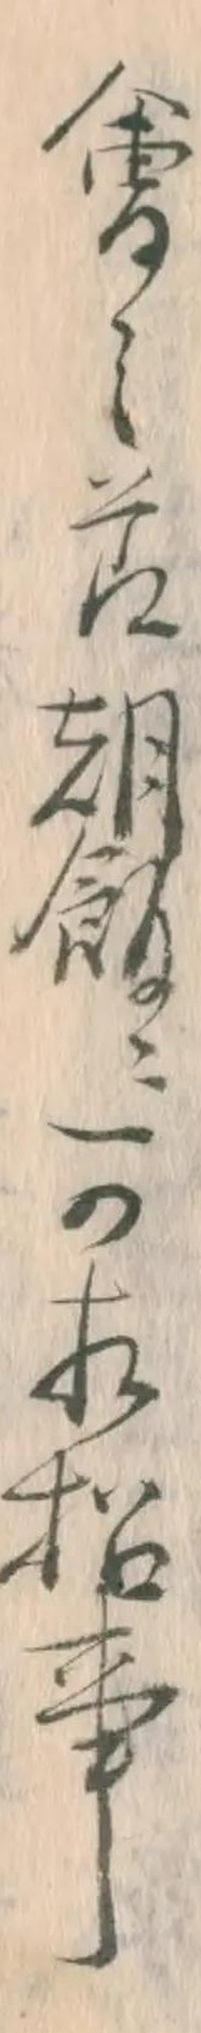會之節朝飯ニ可相招事
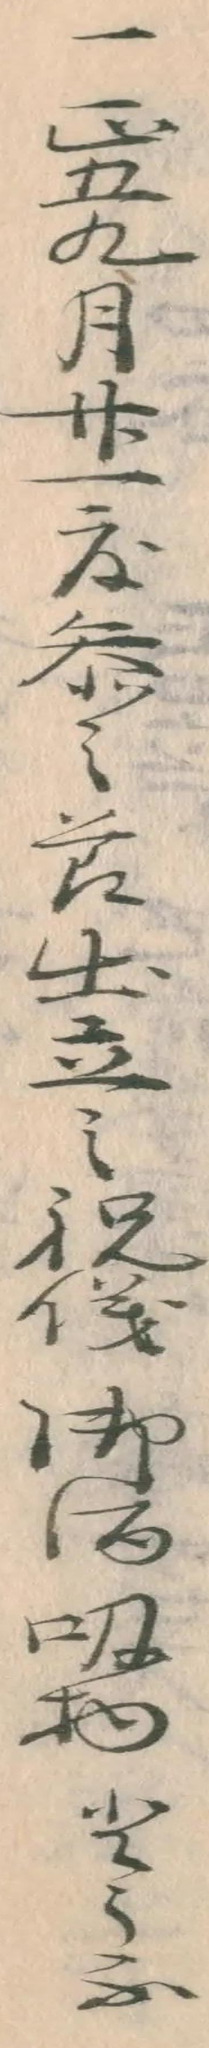一正五九月廿一度参之節出立之祝儀御酒吸物とうふ
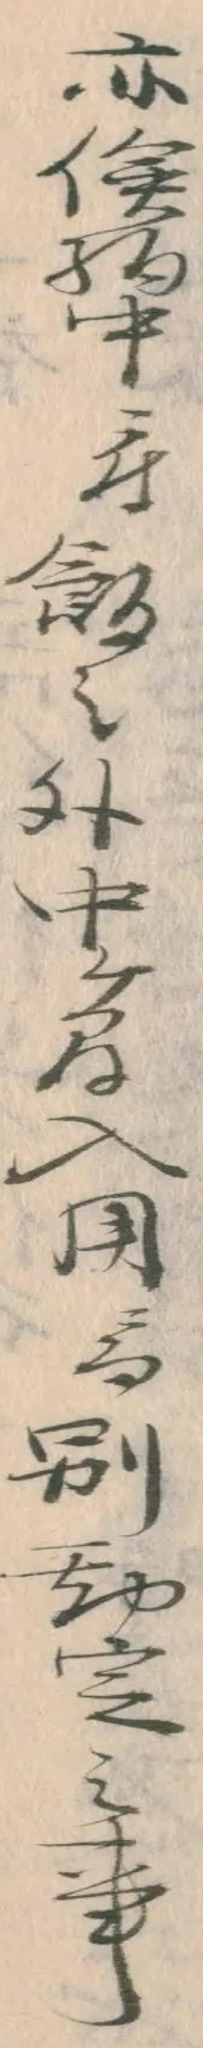亦倹約中ニ付飯之外中ヶ間入用ニ而別勘定之事
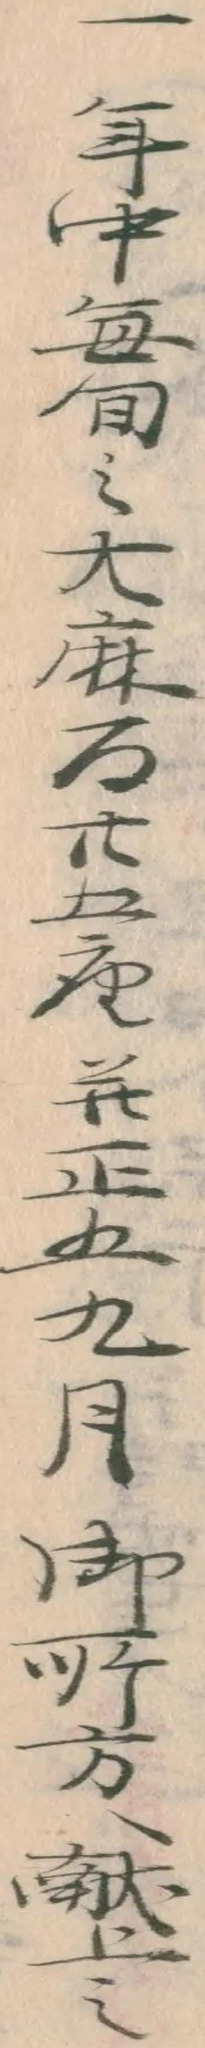一年中毎旬之大麻百廿五座并正五九月御所方へ献上之
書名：賀茂社記録. 第72冊
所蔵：国立国会図書館 National Diet Library, JAPAN
